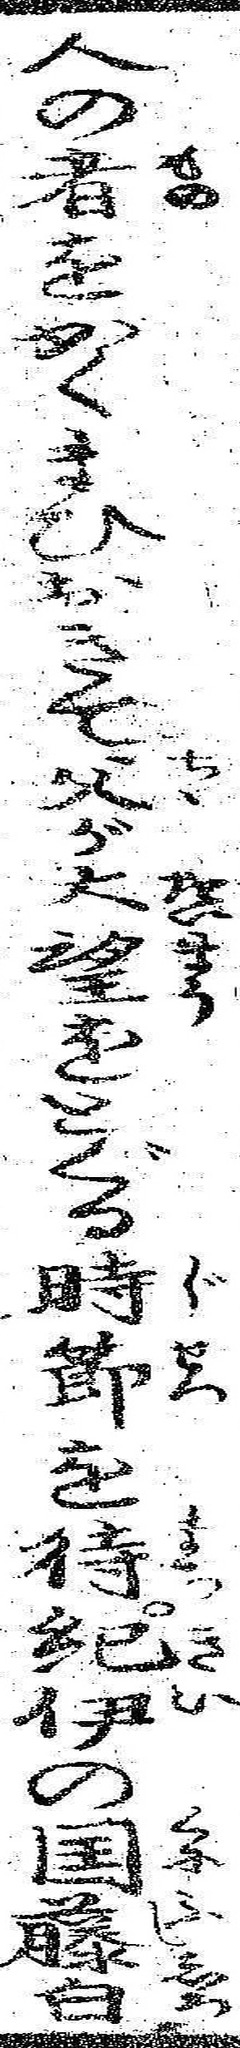人の者をかくまひおきて。父が大望をとぐる時節を待。紀伊の国藤白
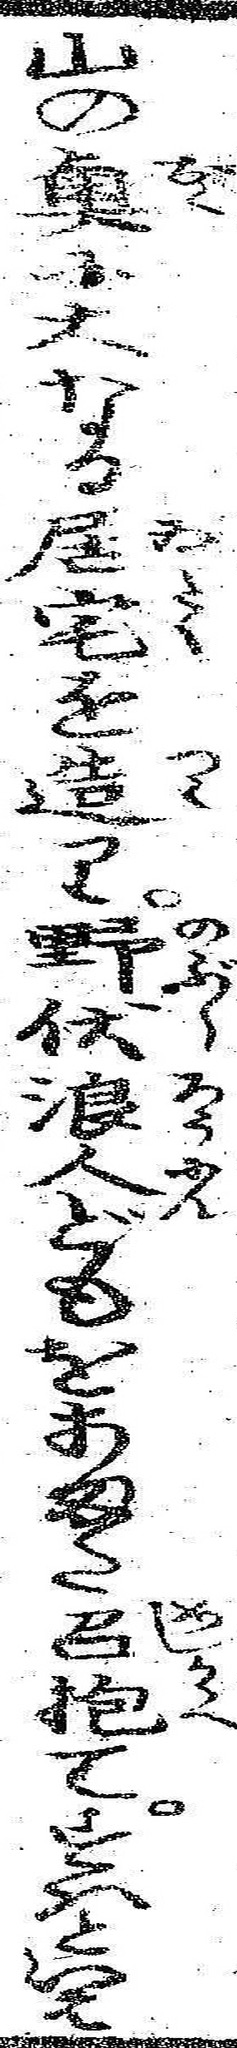山の奥に大なる居宅を造り。野伏浪人どもをあまた召抱て。すはといは
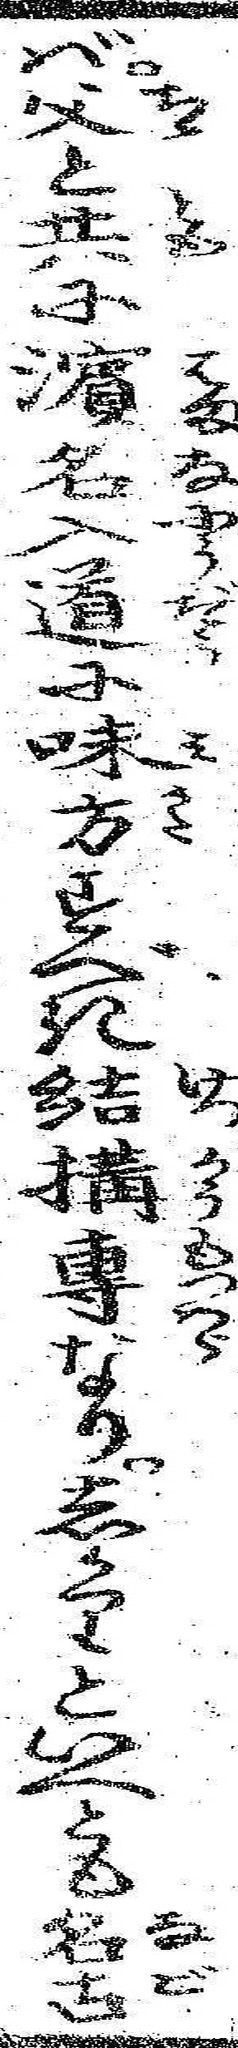ば。父と共に浜名入道に味方すべき結構専なり。しかりといへとも名古
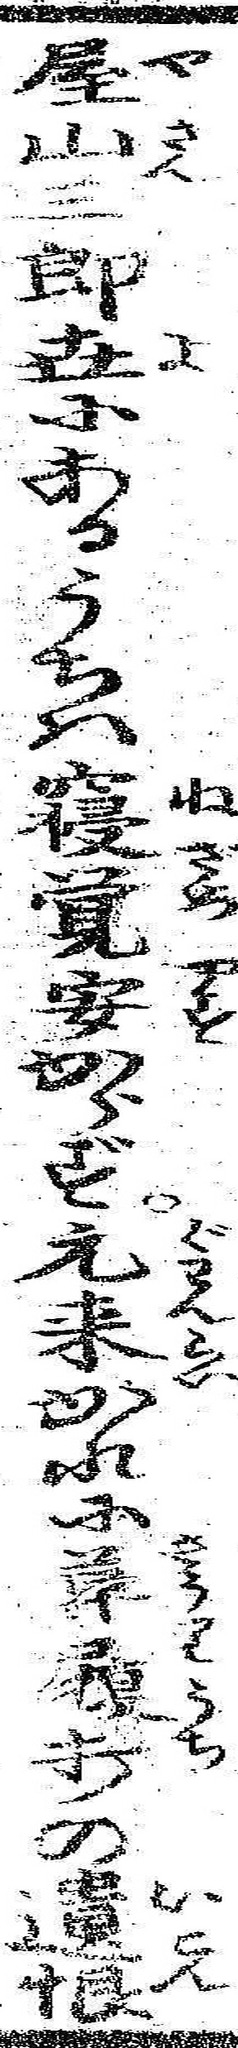屋山三郎世にあるうちは寝覚安からず。元来かれに草履打の遺恨
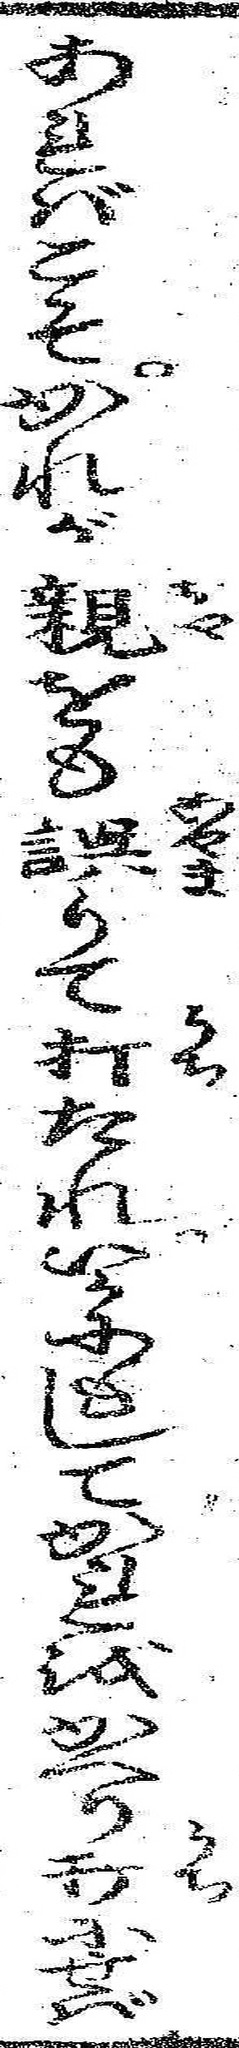あればこそ。かれが親をも誤りて打たれ。いかにもしてかれをかへり打にせば
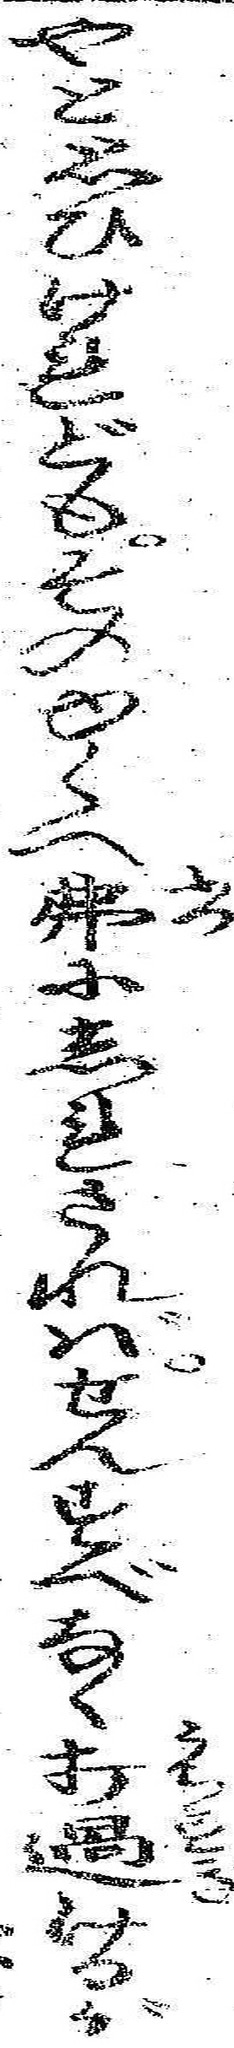やと思ひけれども。そのゆくへ弗にしれされば。せんすべなく打過けるが
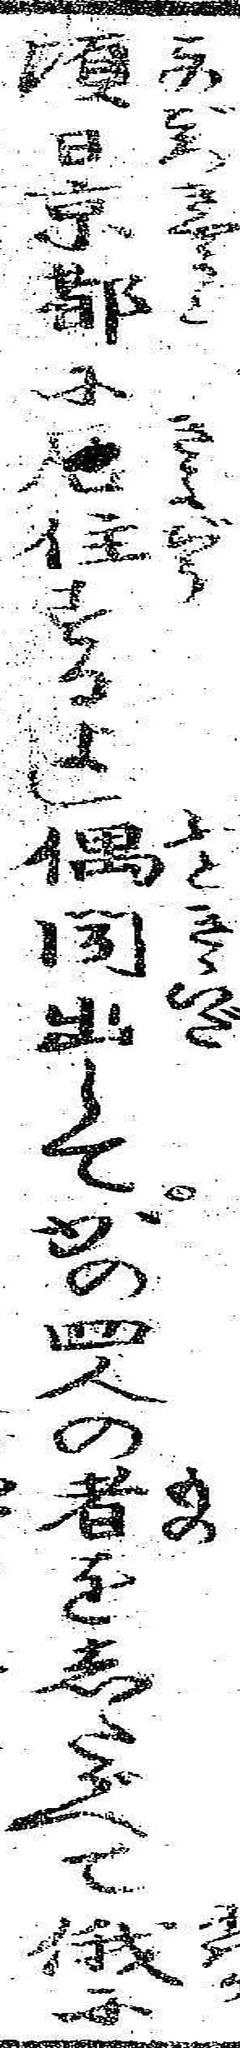頃日京都に居住するよし偶聞出して。かの四人の者をしたがへて俄に
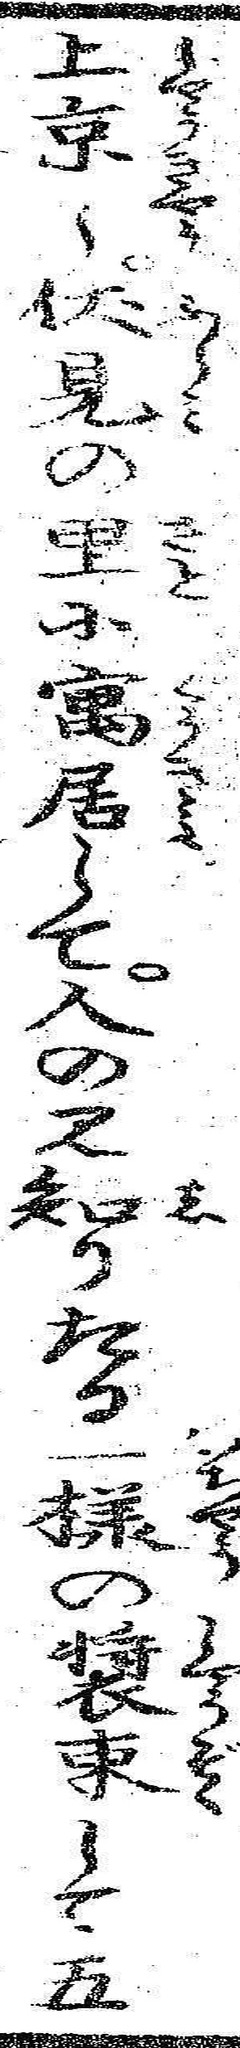上京し。伏見の里に寓居して。人の見知りたる一様の装束して五
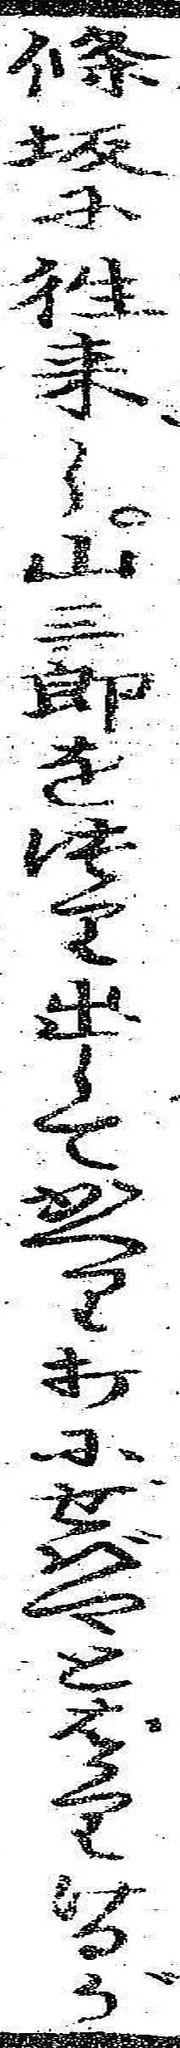条坂に往来し。山三郎をつり出してかへり打にせばやとはかりけるが
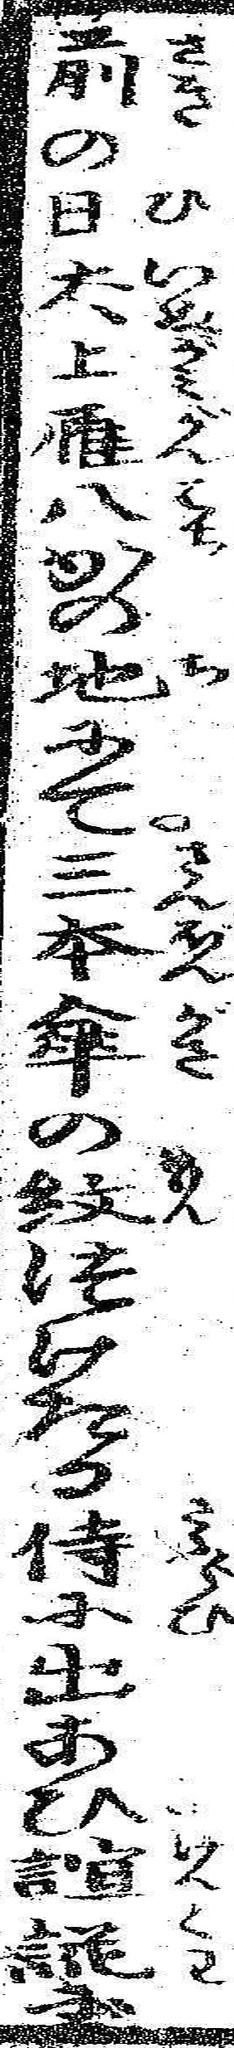前の日犬上雁八かの地にて。三本傘の紋つけたる侍に出あひ。諠誮に
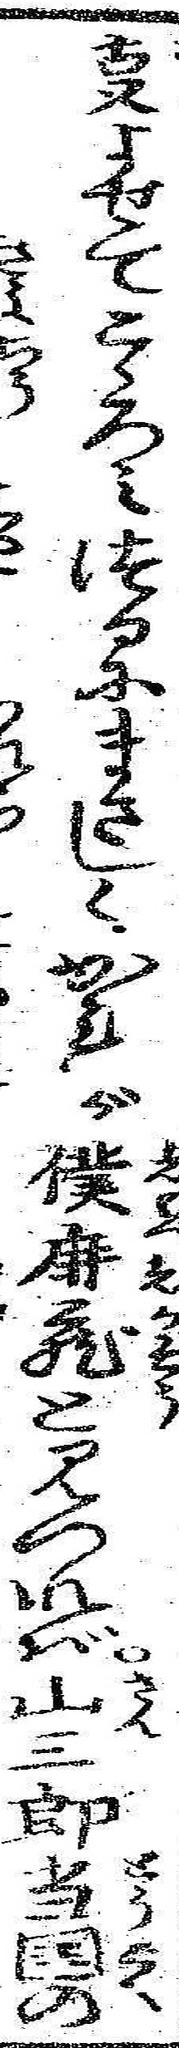事よせてこゝろみつるにまさしくかれが僕鹿蔵と見つれば。山三郎当国の
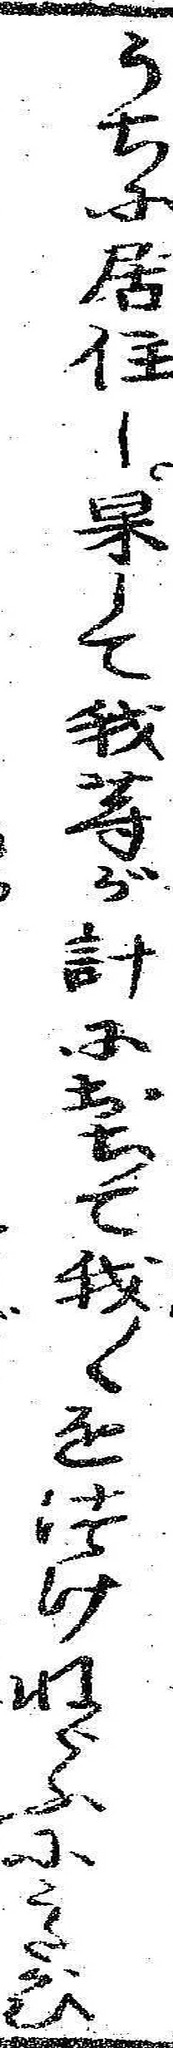うちに居住し。果して我等が計におちて我をつけねらふにうたがひ
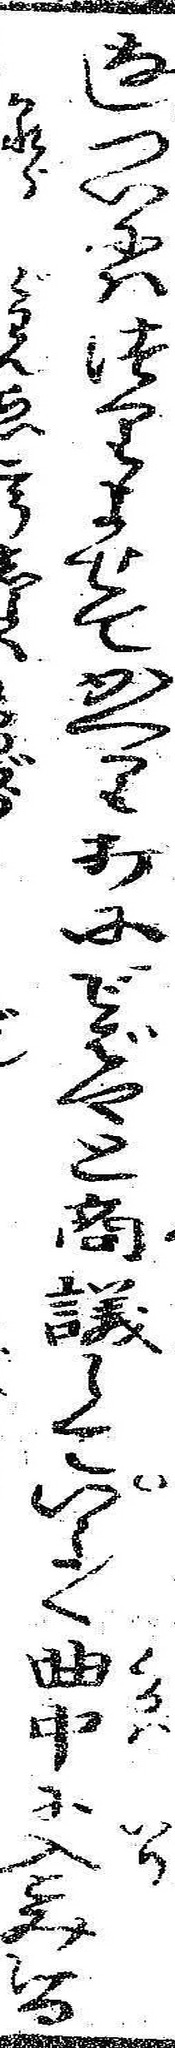なし。ついにはつりよせてかへり打にでばやと商議して。いよ〳〵曲中に入こみける
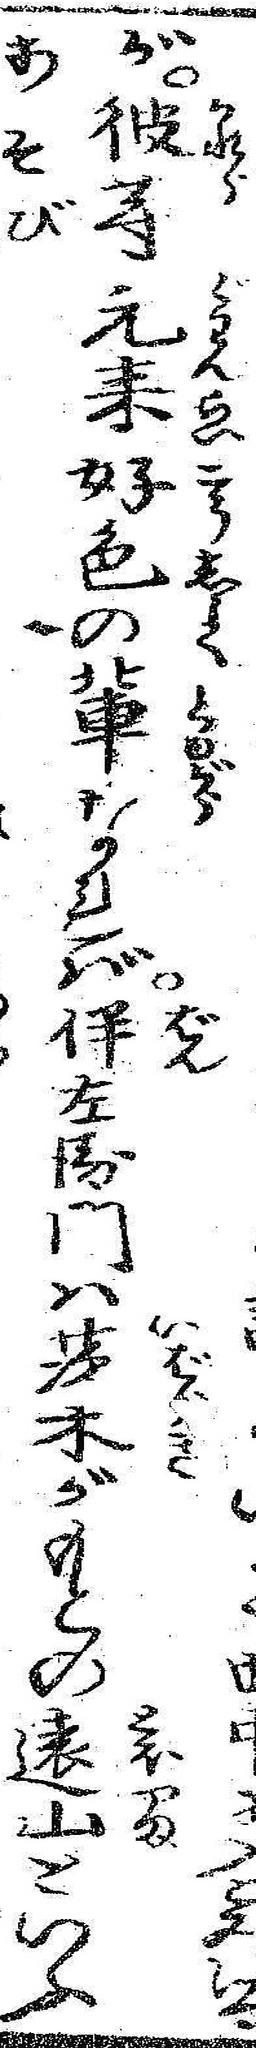が。彼等元来好色の輩なれば。伴左衛門は茨木がもとの遠山といふ
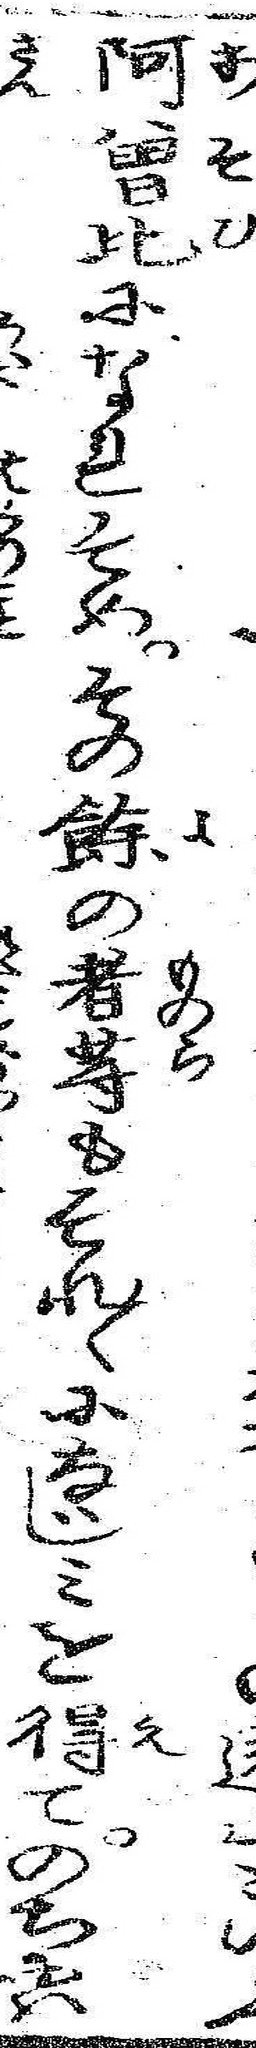阿曽比になれそめ。その余の者等もそれ〳〵になじみを得て。のちには
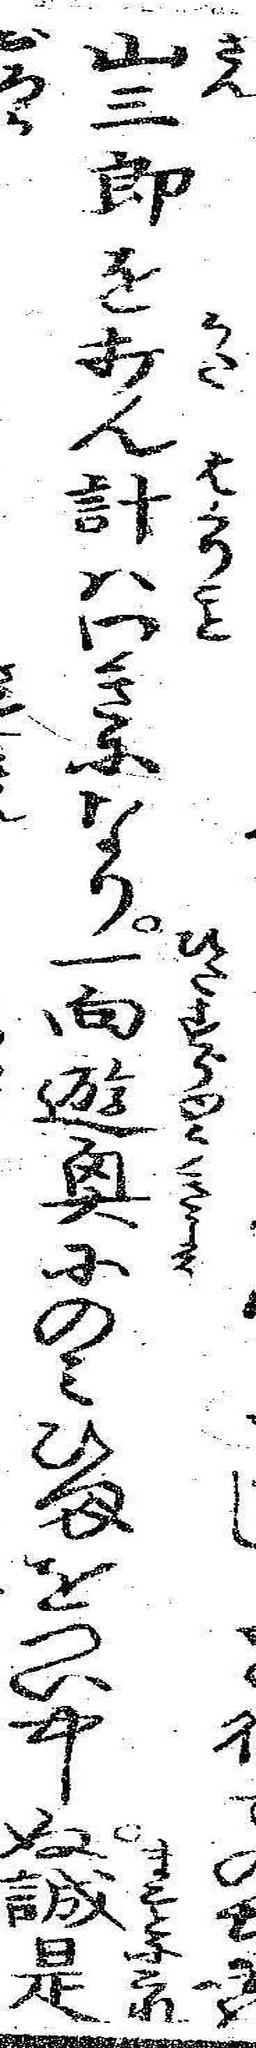山三郎を打ん計はわきになり。一向遊興にのみひまをついやしぬ。誠是
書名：昔話稲妻表紙
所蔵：国文学研究資料館
